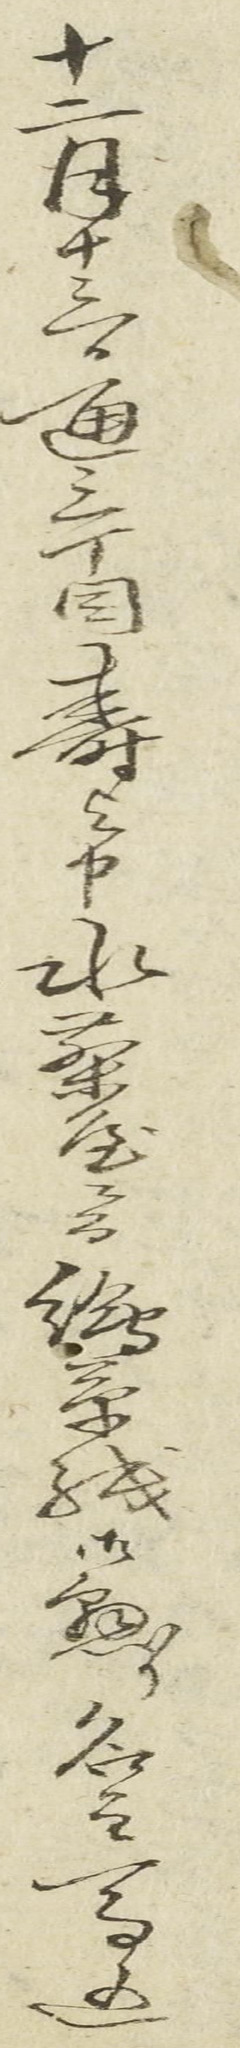十二月十三日通三丁目壽と申水茶屋ニ而絵草紙御懸り名主馬込
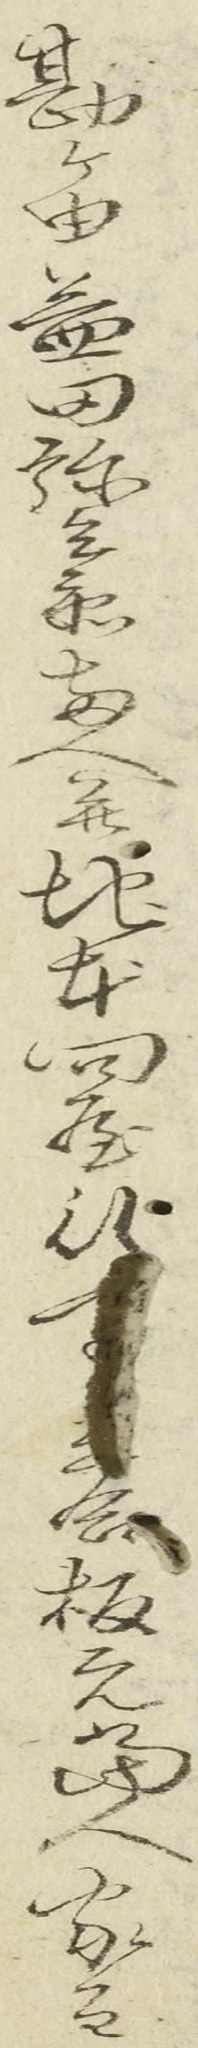勘ケ由益田弥兵衛両人幷地本問屋行事立合板元当人家主
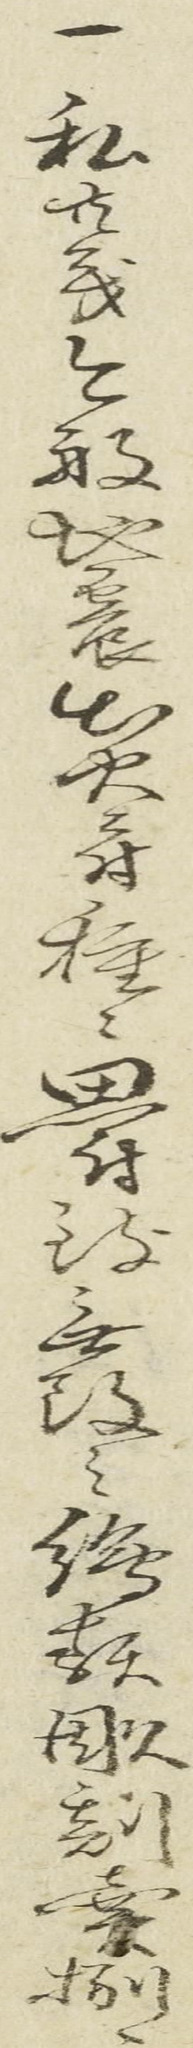一私共義今般地震出火二付種々思付致無改之絵類彫刻売捌候
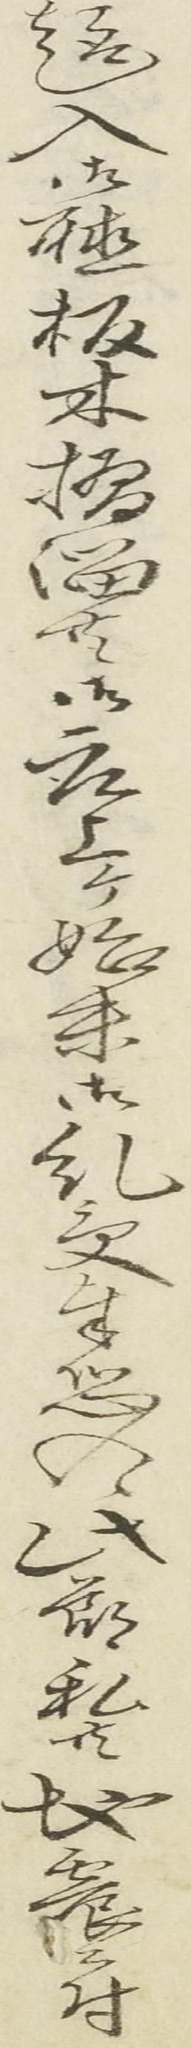趣入御聴板木摺溜共御取上ケ始末御糺受奉恐入候此節私共地震ニ付
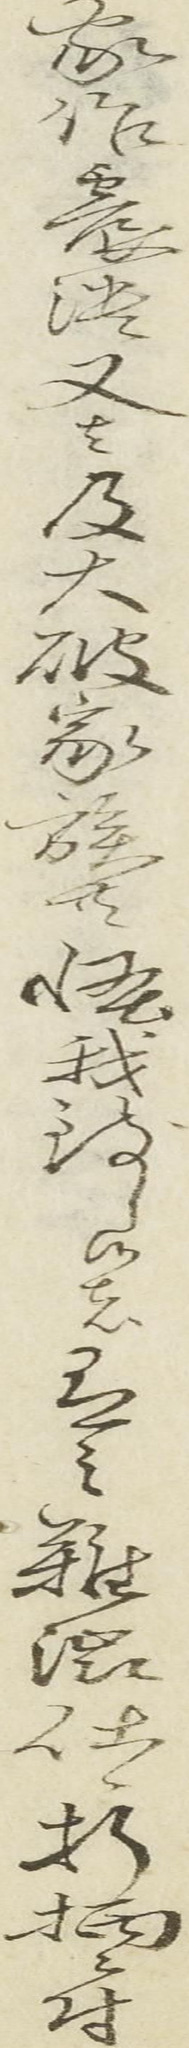家作震潰又は及大破家族共怪我致候者有之難渋仕候折柄ニ付
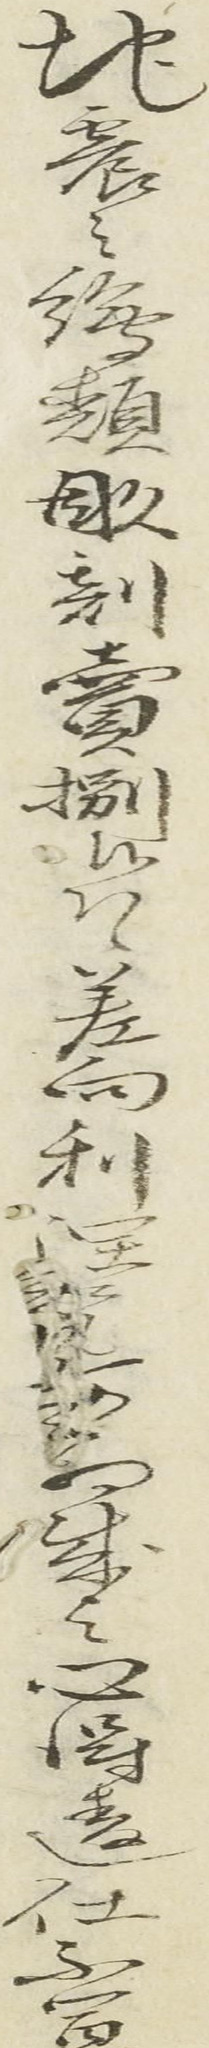地震之絵類彫刻売捌候ハゝ差向利潤相成と心得違仕不宜
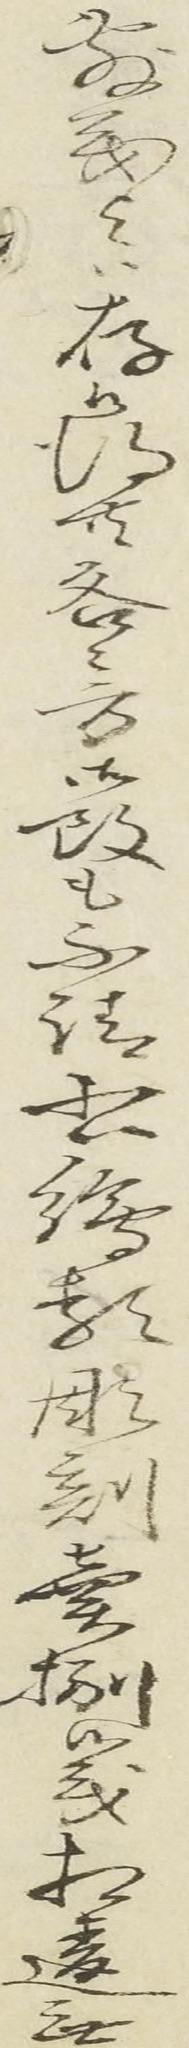敷義とハ存候得共各々方御改も不請書絵類彫刻売捌候義相違無
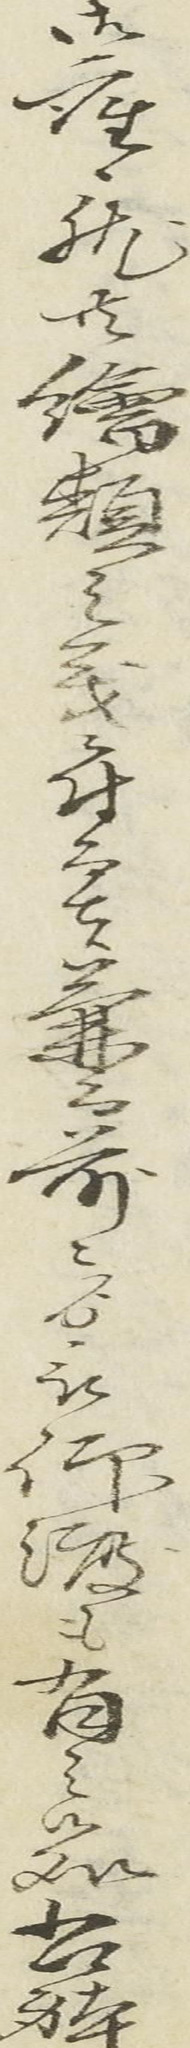御座候然共絵類之義ニ付而は兼而前々ゟ被仰渡も有之候処右躰
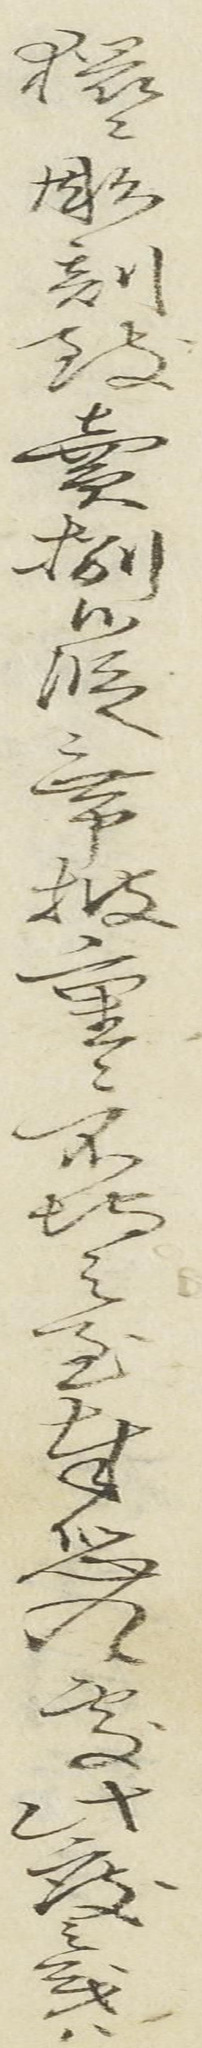猥ニ彫刻致売捌候段無申披重々不埒之至奉恐入候處此度之義ハ
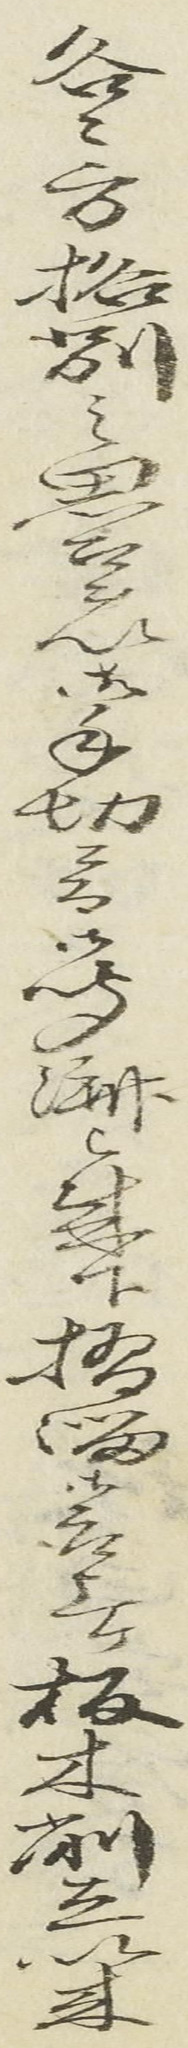各々方格別之思召ヲ以御手切ニ而御聞済被成下摺溜御取上ケ板木削立以来
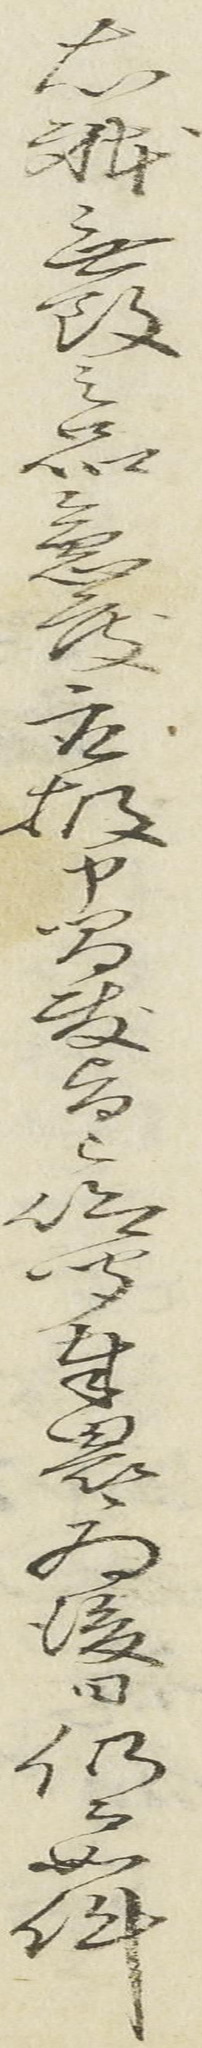右躰無改之品急度取扱申間敷旨被仰聞奉畏候為後日仍而如件
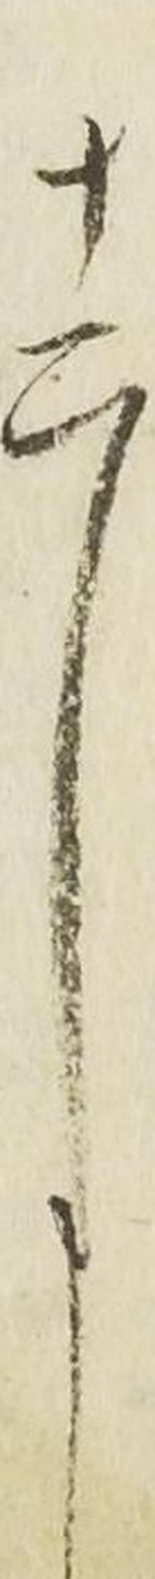十二月
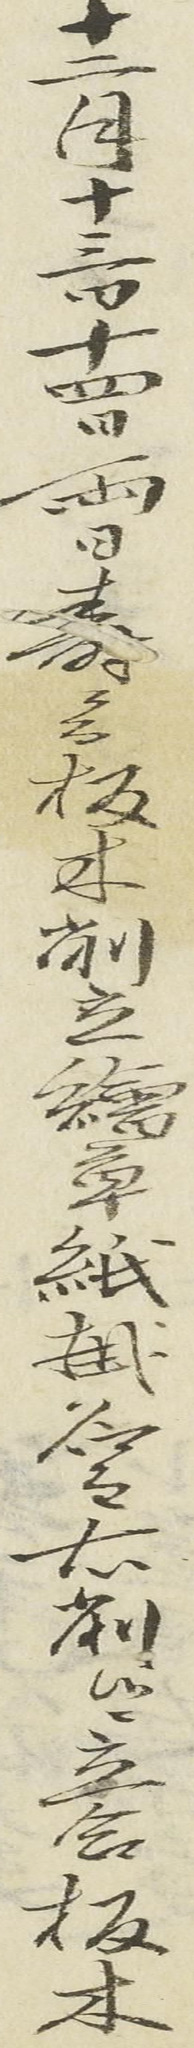十二月十三日十四日両日壽ニ而板木削立絵草紙掛名主右削候ニ立合板木
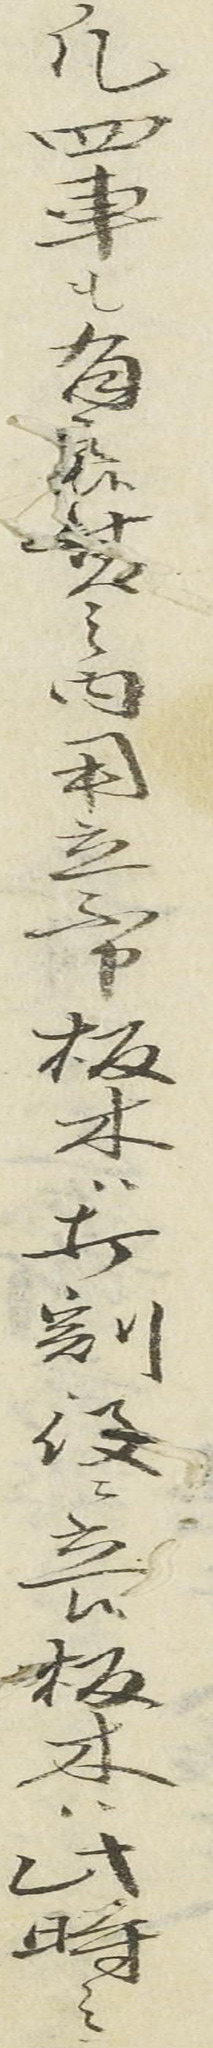凡四車も有之候其之内用立不申板木ハ打割役ニ立候板木ハ此時之
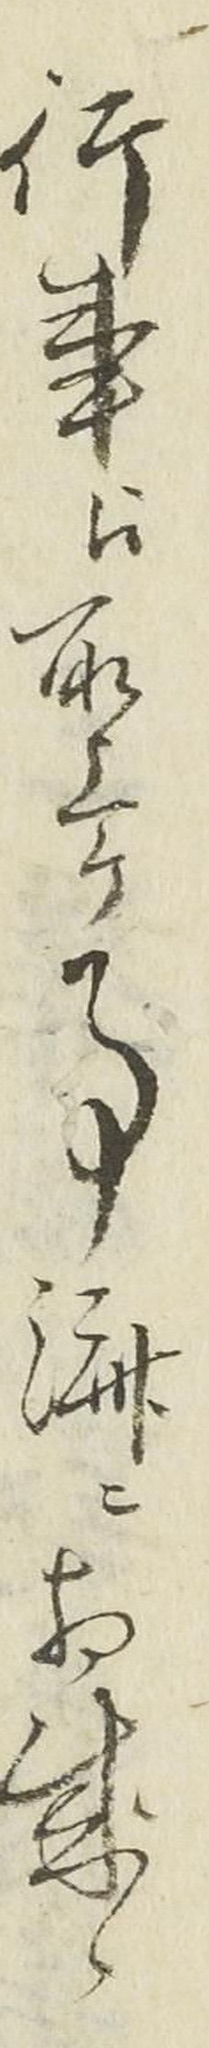行事え取上ケ事済ニ相成候

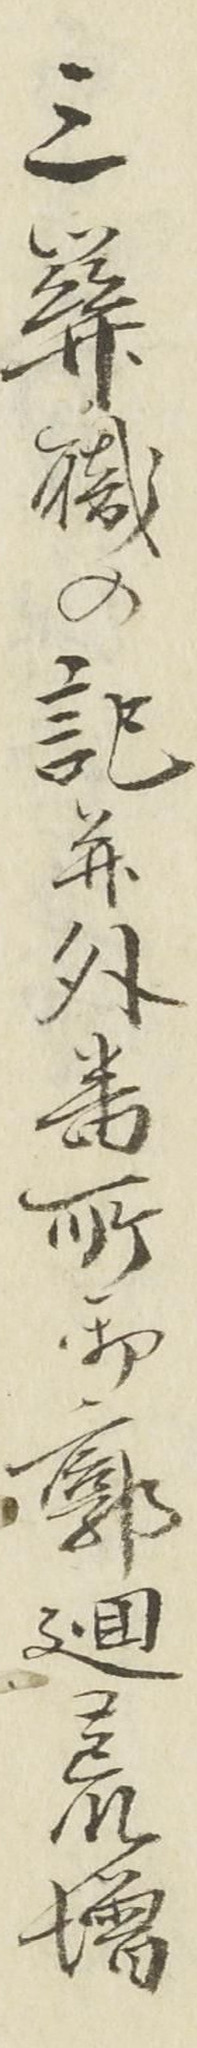三関職の記幷外番所御廓廻荒増
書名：安政二乙卯年十月二日大地震之事
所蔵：東京大学地震研究所図書室 Earthquake Research Institute Library, The University of Tokyo, JAPAN
